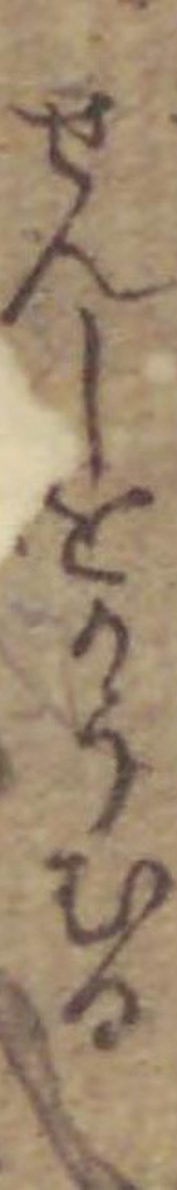せんしをかうむる
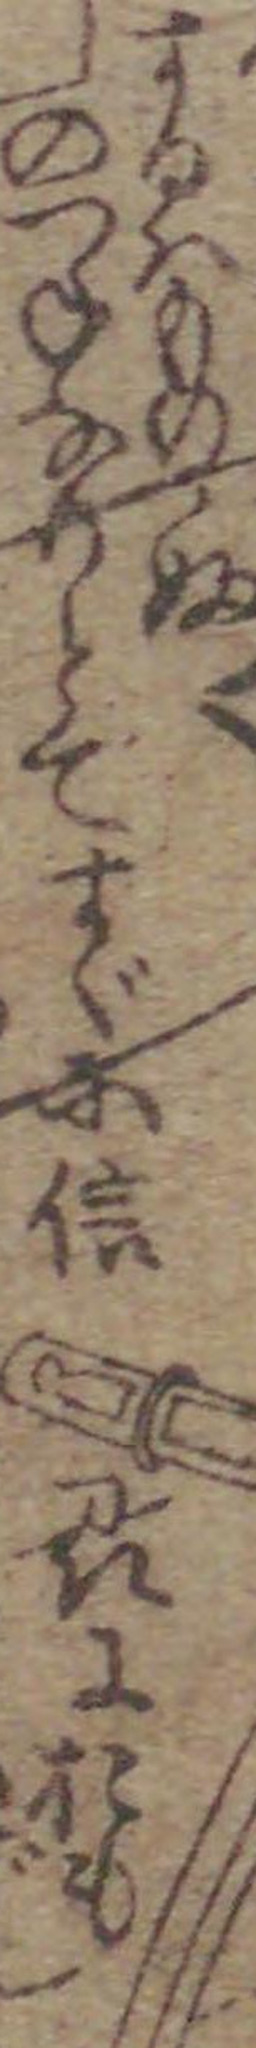のつねなりとてすぐに信州におも
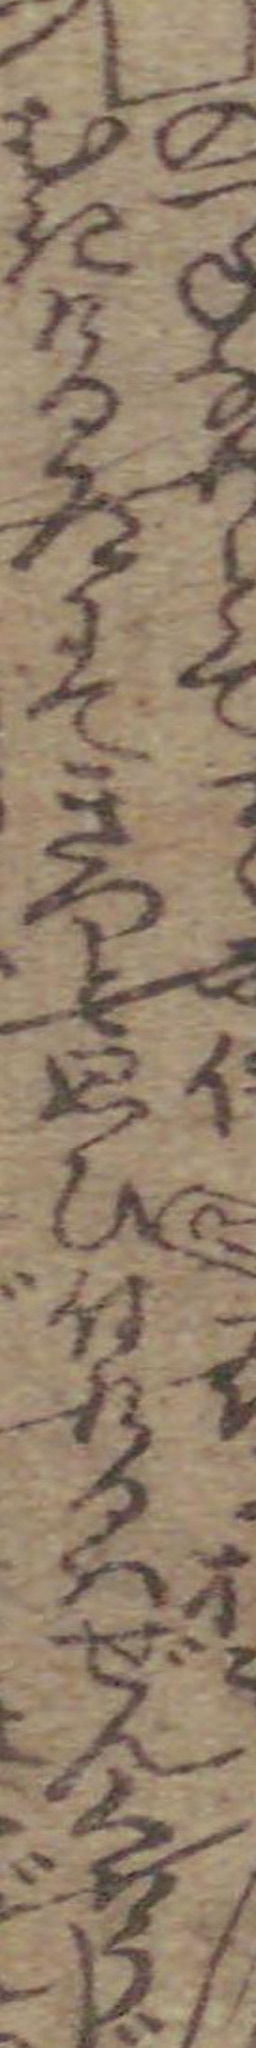むきける道にてきつと思ひ付けるはぜんくわうじ
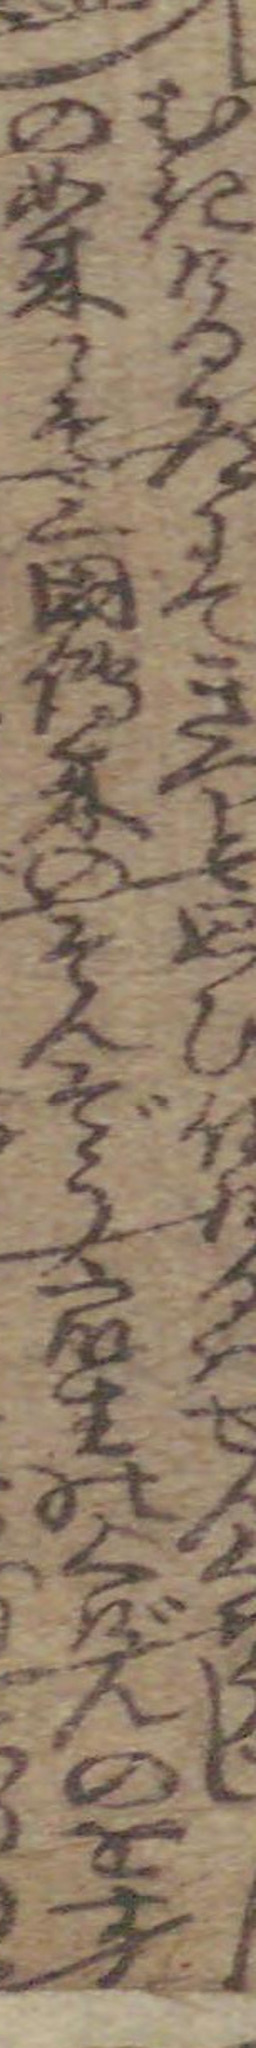の如来こそ三国伝来のそんぞう衆生のくげんのおすはせ

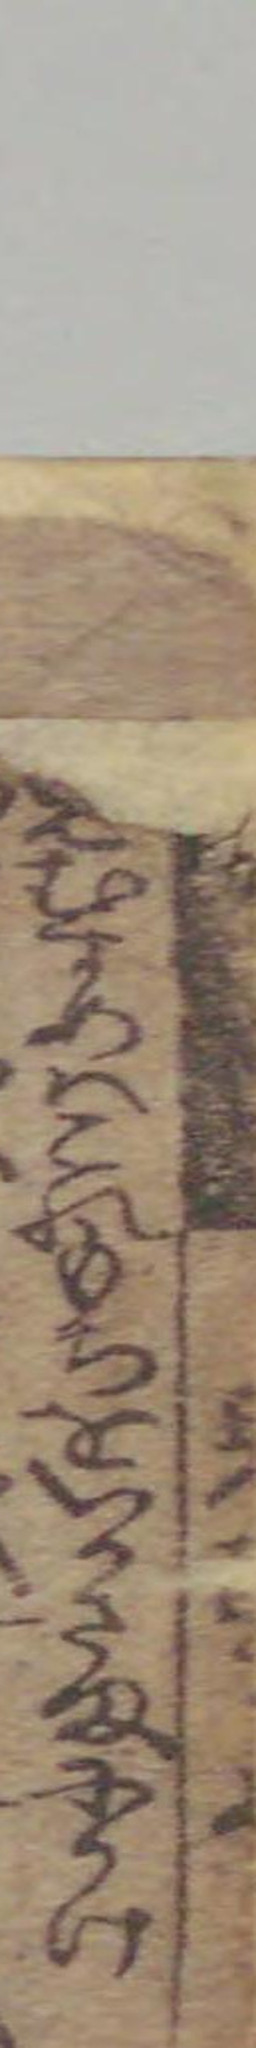鬼むすめはこれもちをいかさまにかけ
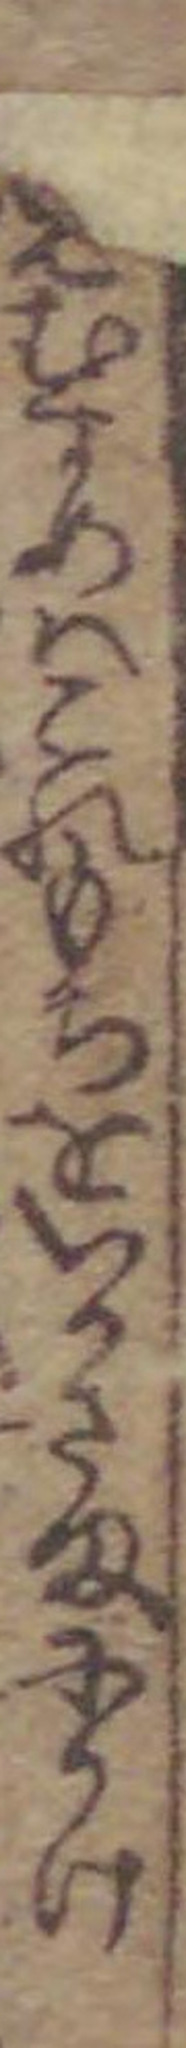鬼むすめはこれもちをいかさまにかけ
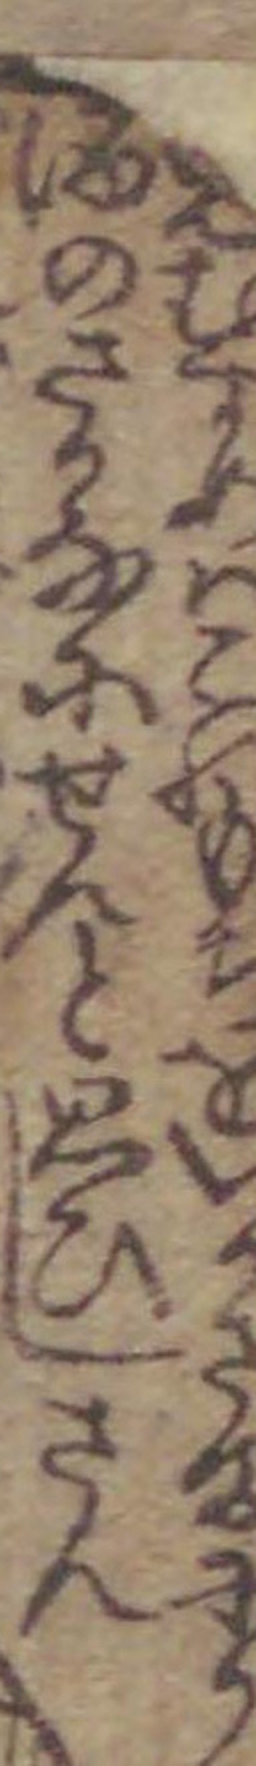酒のさかなにせんと思ひしさん
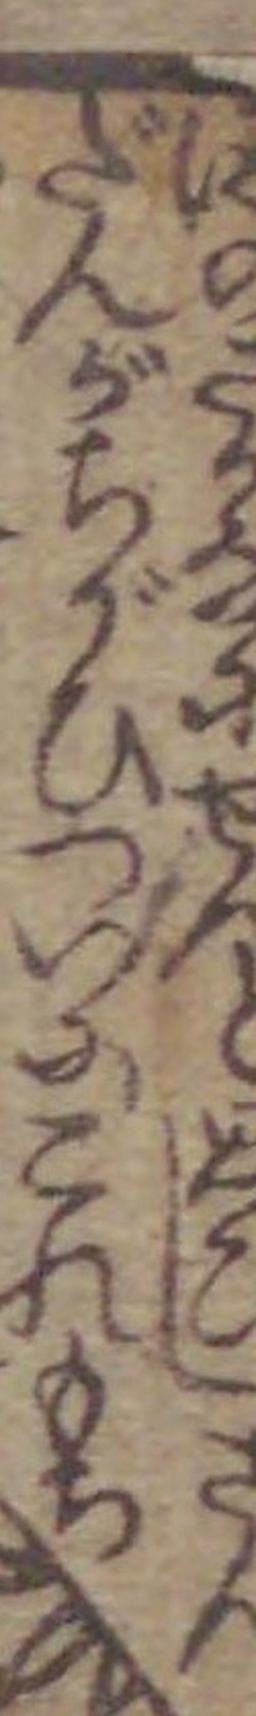だんがちがひついにこれもち
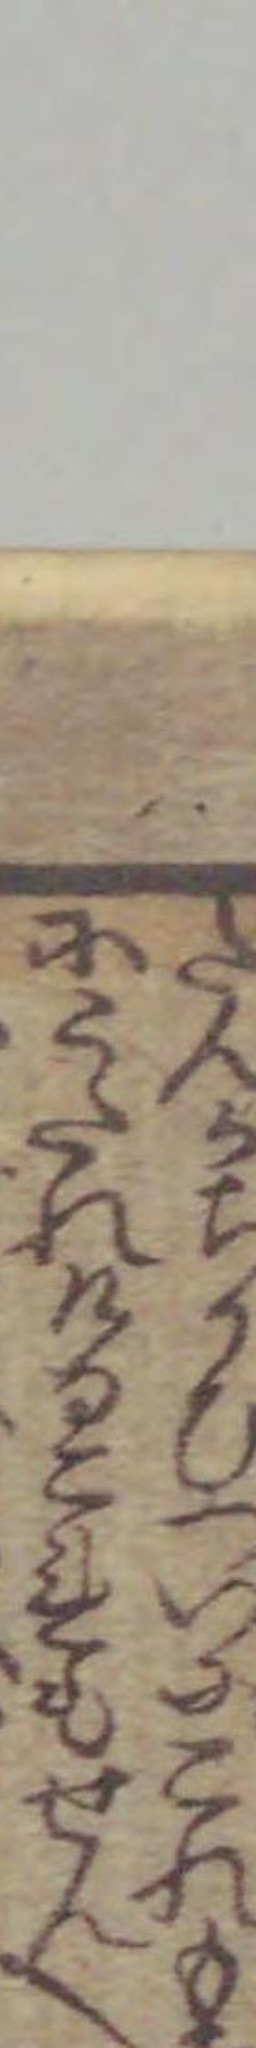にうたれけるこれもせん
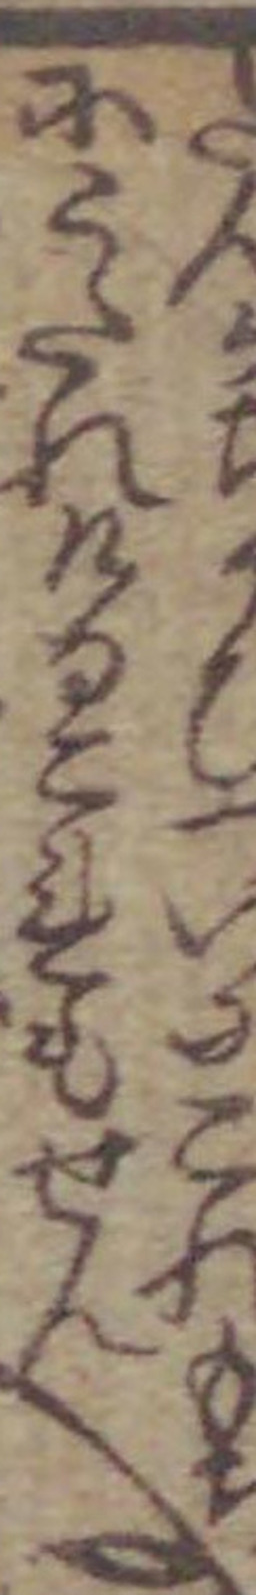にうたれけるこれもせん
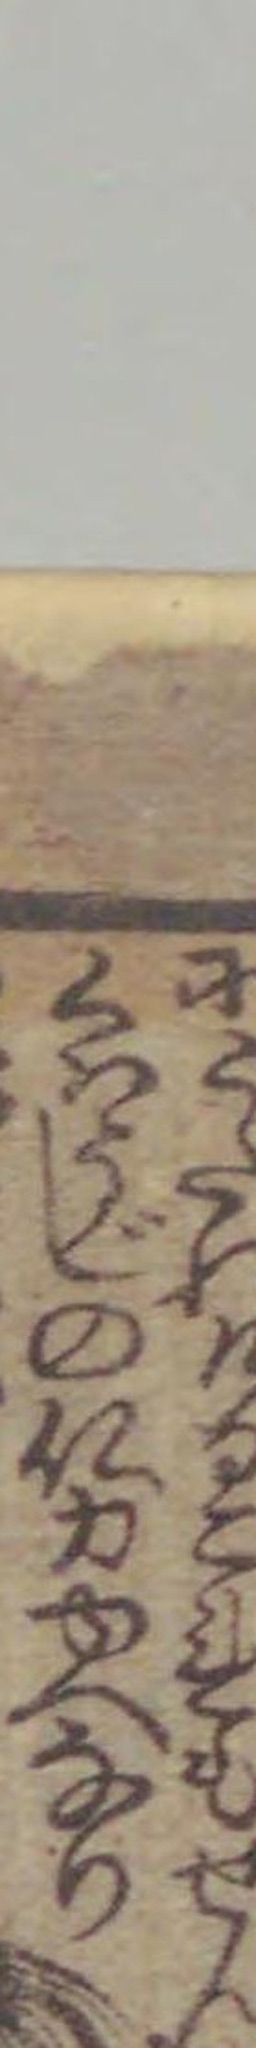くわうじの仏力ゆへなり
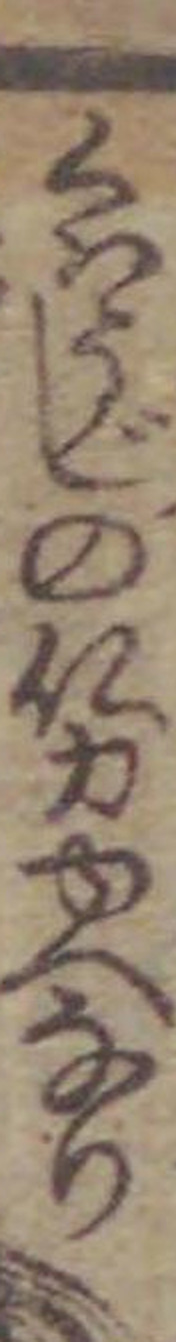くわうじの仏力ゆへなり
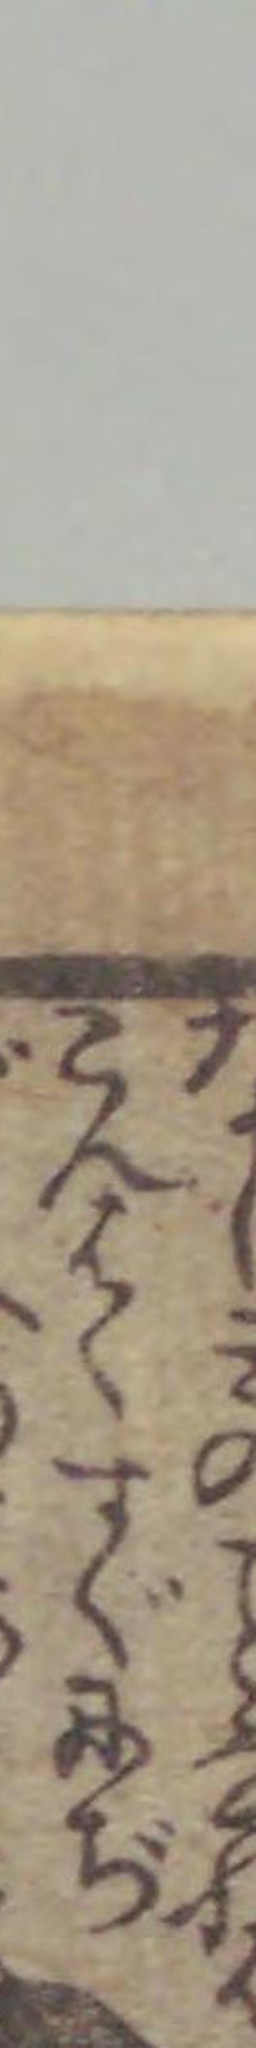こんはくすぐにぢ
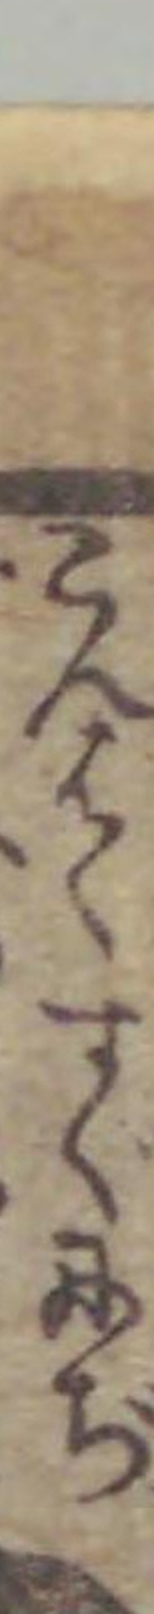こんはくすぐにぢ
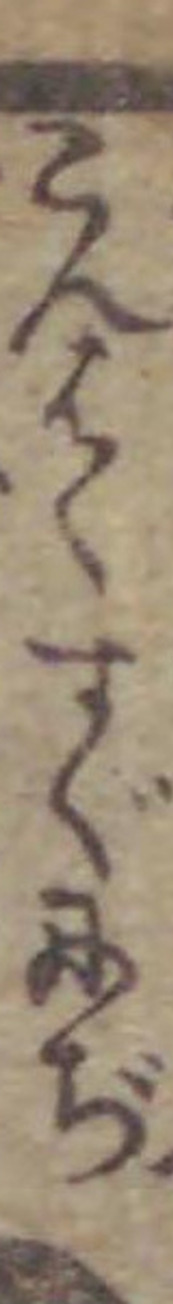こんはくすぐにぢ
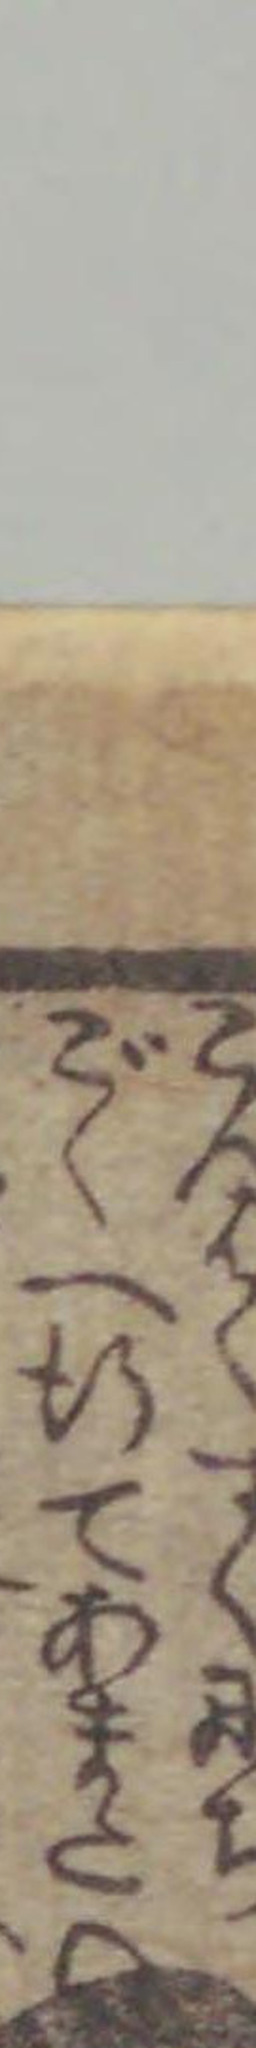ごくへ行てあまた
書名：鬼の趣向草 2巻
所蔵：国立国会図書館 National Diet Library, JAPAN
